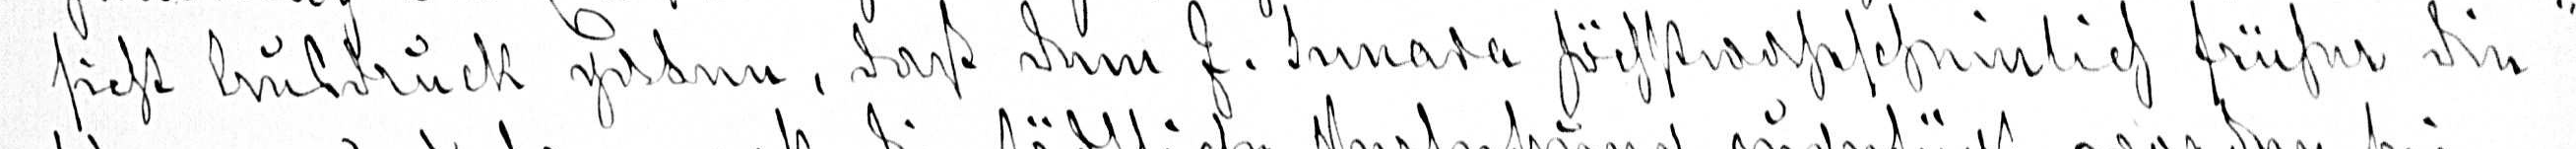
sicht Ausdruck gaben, daß dem J. Iunara höchstwahrscheinlich früher die
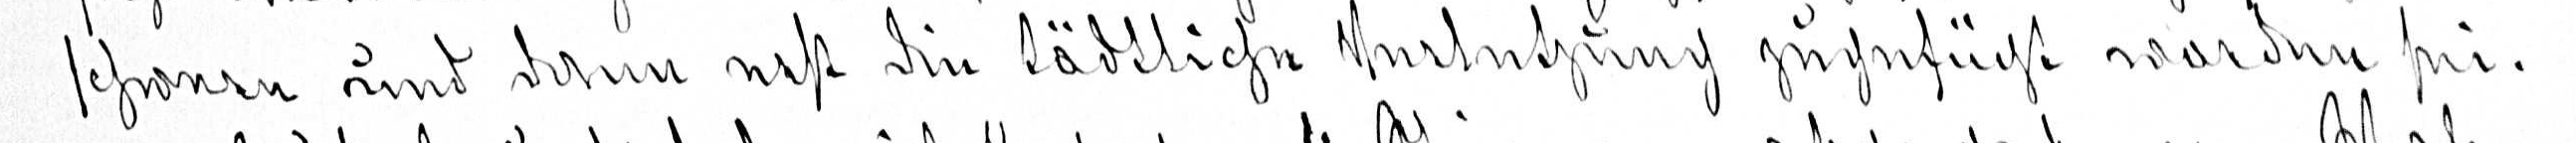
schwere und dann erst die tödtliche Verletzung zugefügt worden sei.
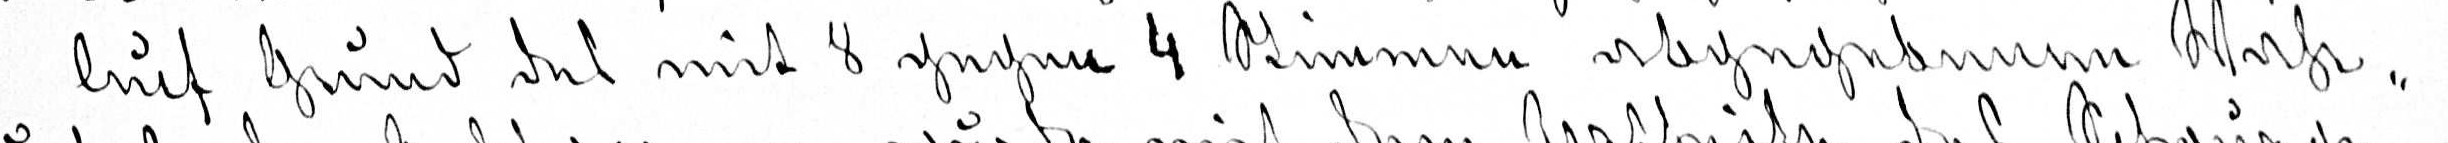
Auf Grund des mit 8 gegen 4 Stimmen abgegebenen Wahr¬
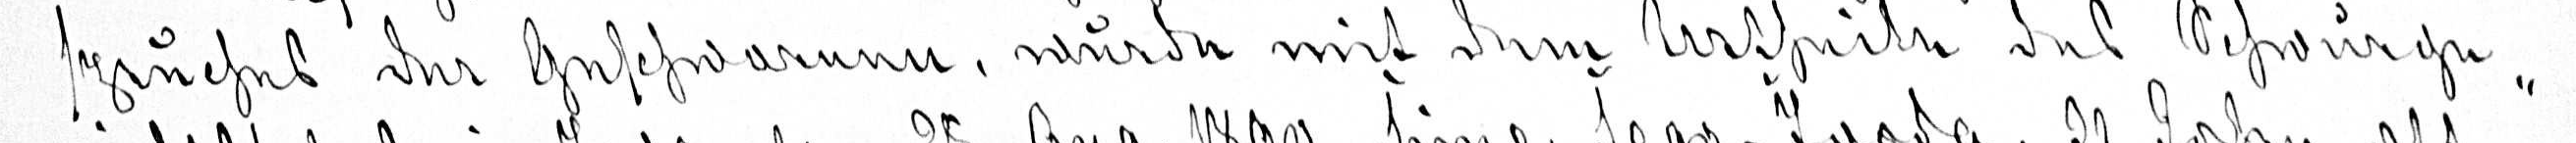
spruches der Geschworenen, wurde mit Urtheile des Schurge¬
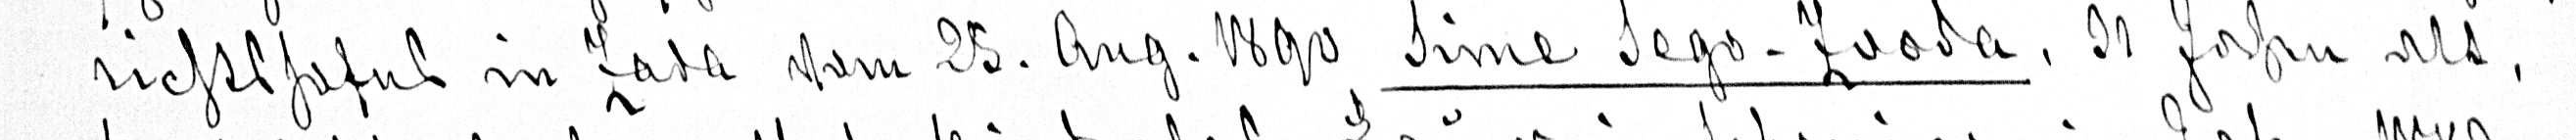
richtshofes in Zara vom 25. Aug. 1890 Šime Šego-Žvoda, 30 Jahre alt,
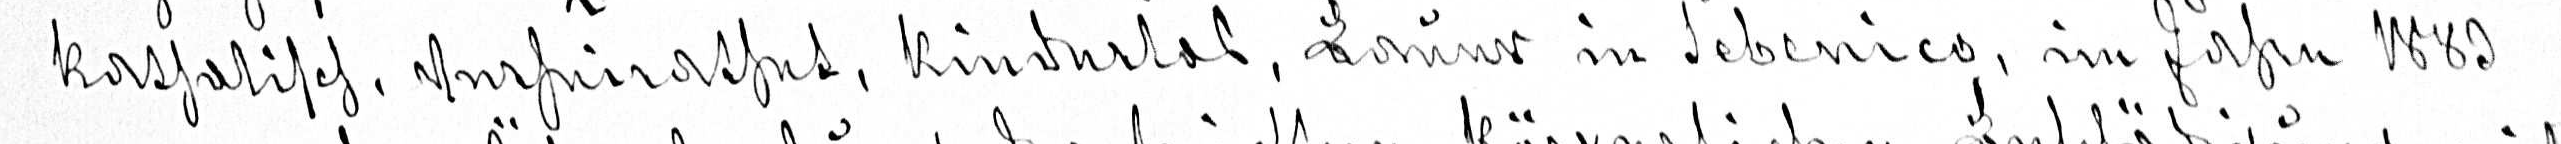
katholisch, verheirathet, kinderlos, Bauer in Sebenico, im Jahre 1883
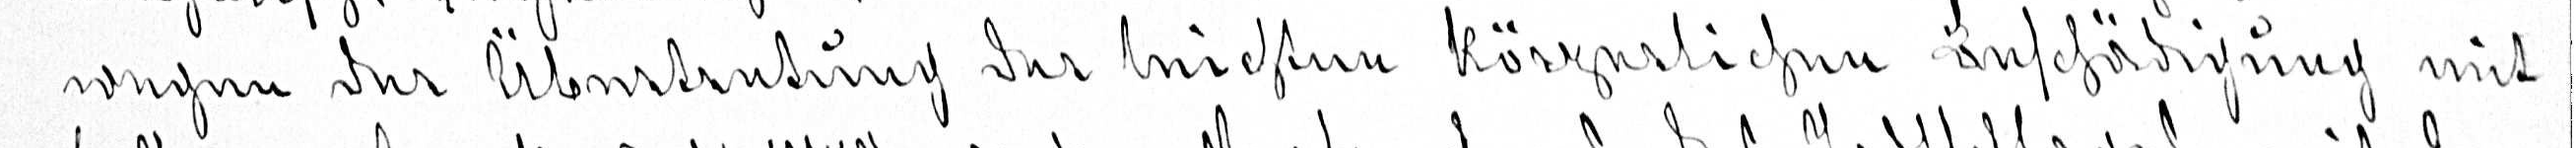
wegen der Übertretung der leichten körperlichen Beschädigung mit
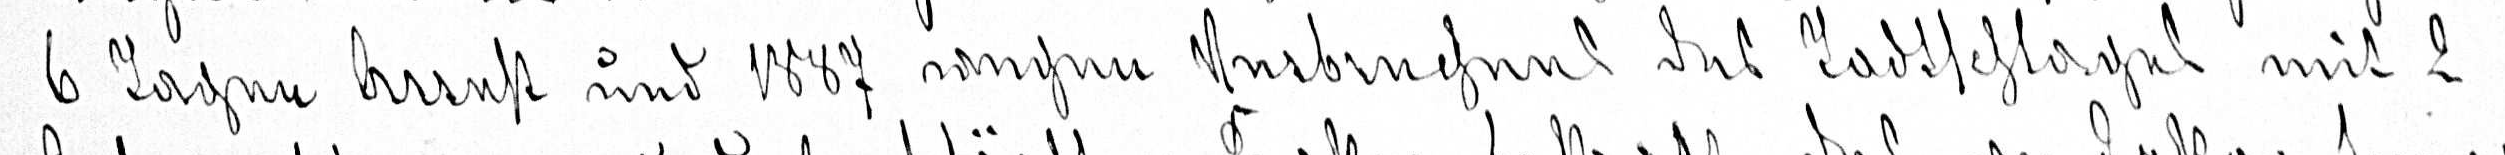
6 Tagen Arrest und 1887 wegen Verbrechens des Todtschlages mit 2
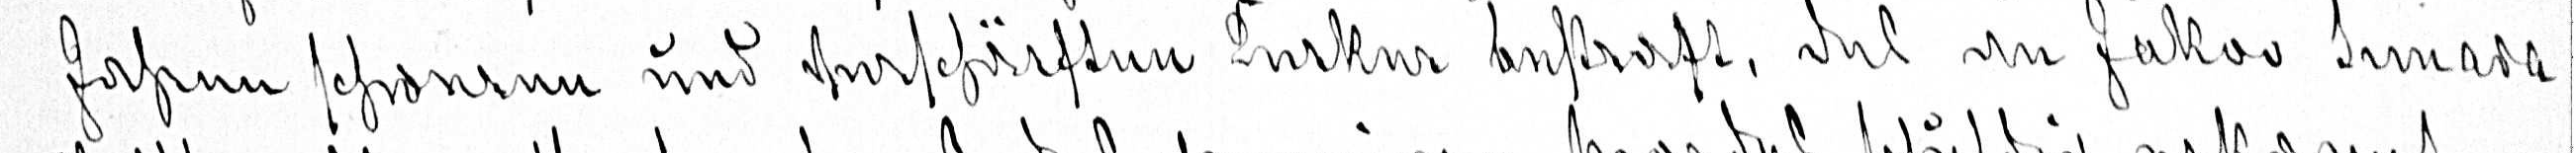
Jahren schweren und verschärften Kerker bestraft, das an Jakov Iunara
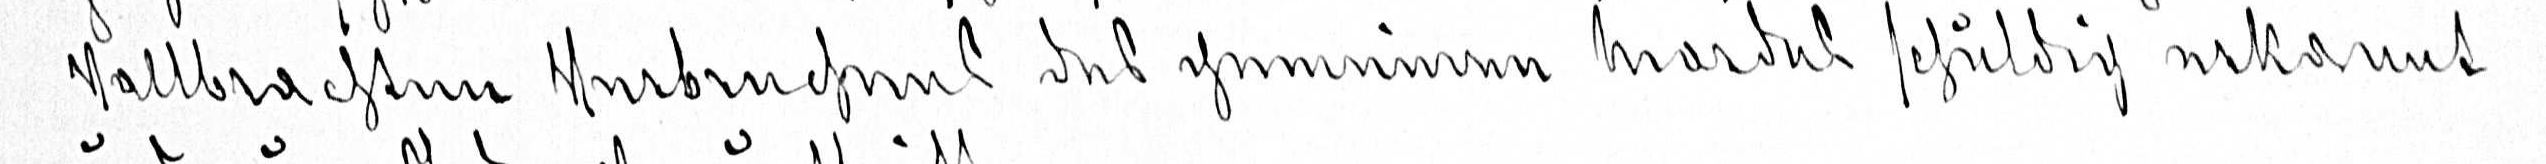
vollbrachten Verbrechens des gemeinen Mordes schuldig erkannt
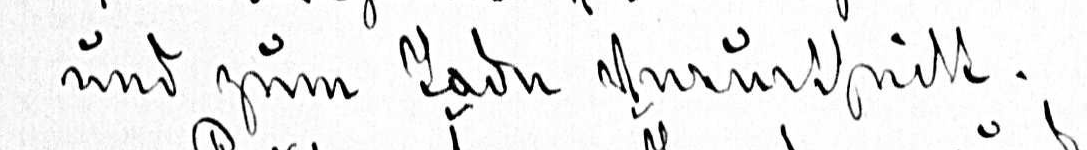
und zum Tode verurtheilt.
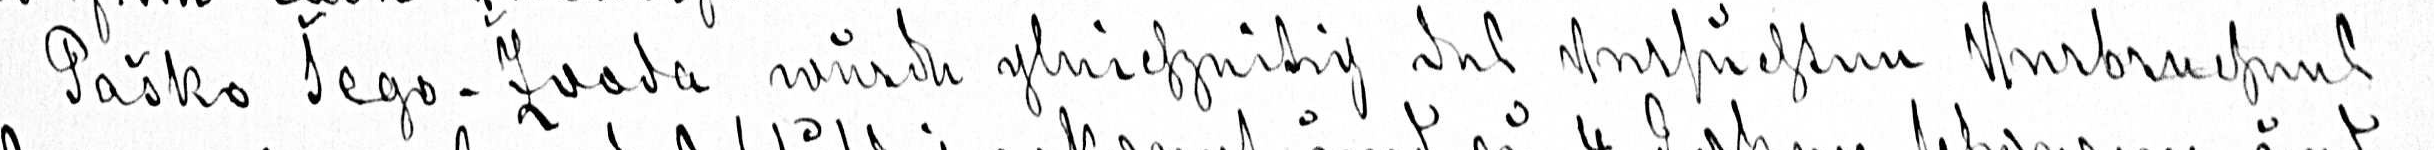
Paško Šego-Žvoda wurde gleichzeitig des versuchten Verbrechens
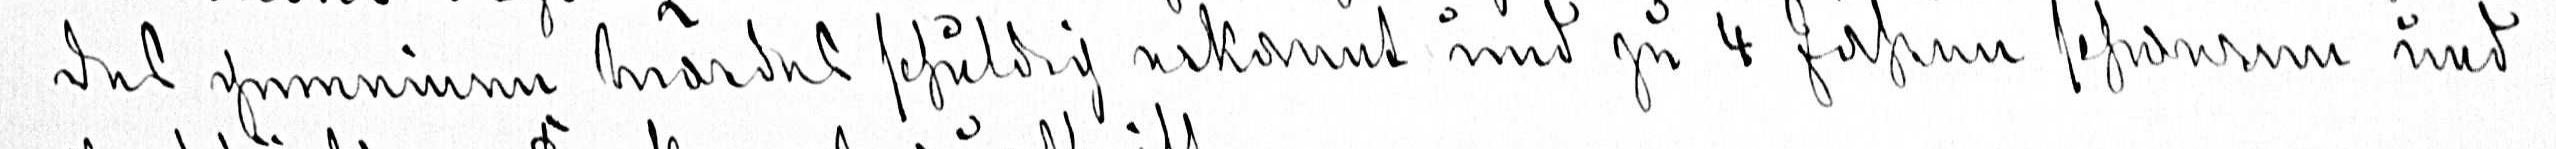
des gemeinen Mordes schuldig erkannt und zu 4 Jahren schweren und
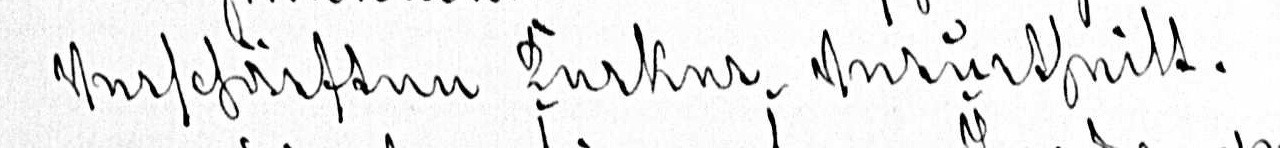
verschärften Kerker verurtheilt.
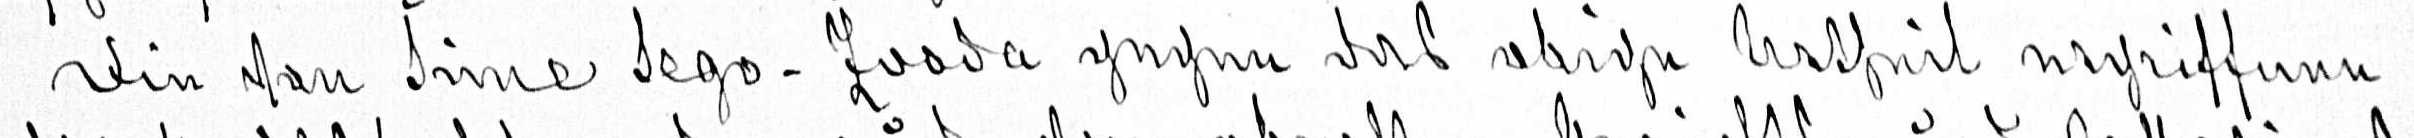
Die von Šime Šego-Žvoda gegen das obige Urtheil ergriffene
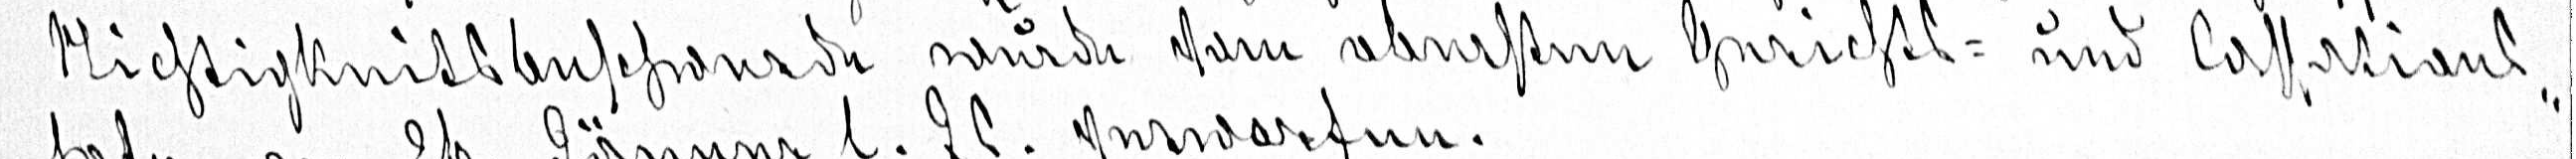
Nichtigkeitsbeschwerde wurde vom abersten Gerichts- und Cassations¬
